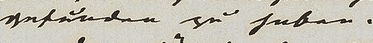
gefunden zu haben. –
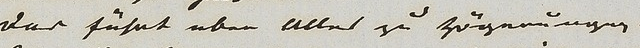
Das führt aber Alles zu Zögerungen.
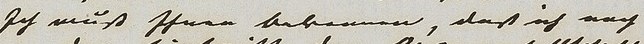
Ich muß Ihnen bekennen, daß ich noch
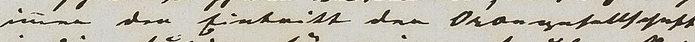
immer den Eintritt der Orongesellschaft
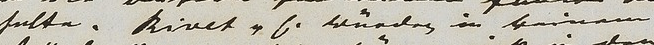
halte. Rivet & Co würden in keinem
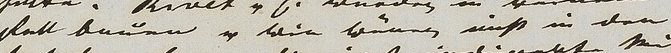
Fall bauen & wir wären nicht in der
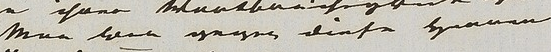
sein. Man war gegen diese Herren
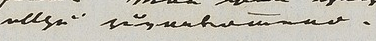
allzu zuvorkommend. –
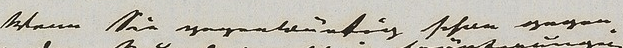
Wenn Sie gegenwärtig schon gegen-
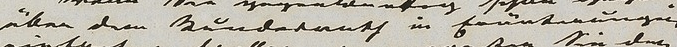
über dem Bundesrath in Erörterungen
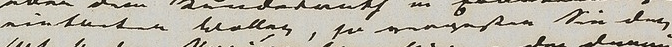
eintreten wollen, so vergeßen Sie den
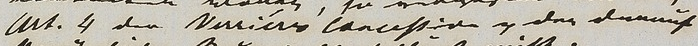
Art. 4 der Verriéres Concession & den darauf
